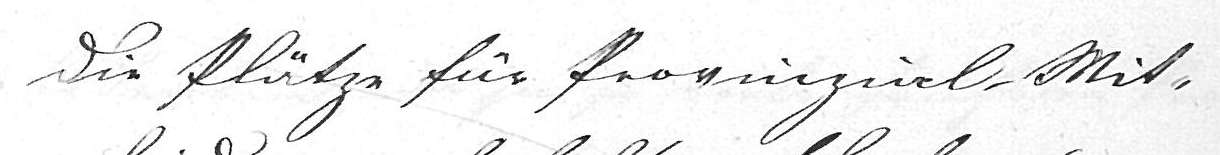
die Plätze für Provinzial-Mit-
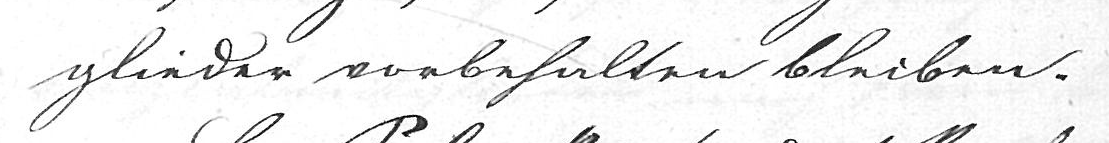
glieder vorbehalten bleiben.
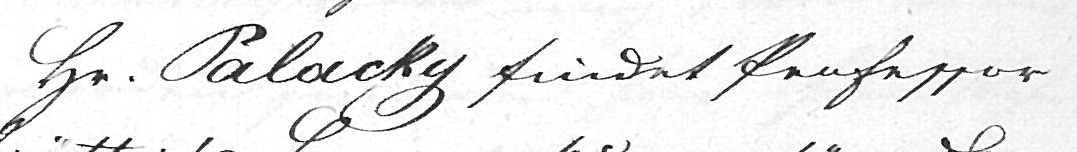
Hr. Palacky findet Professor
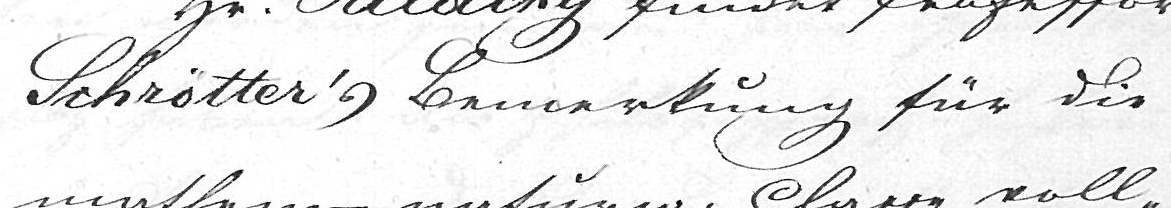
Schrötter's Bemerkung für die
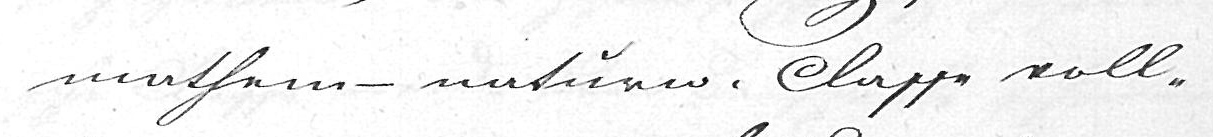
mathem-naturw. Classe voll-
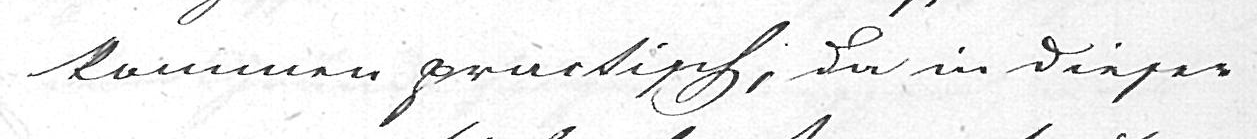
kommen practisch, da in dieser
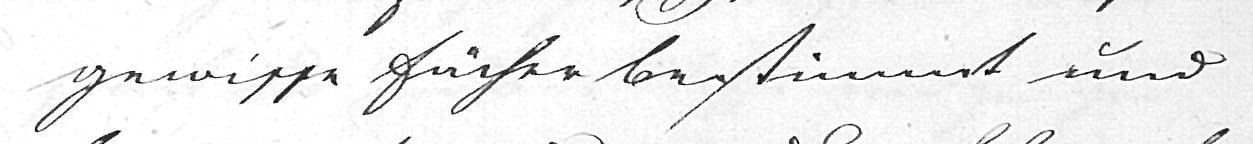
gewisse Fächer bestimmt und
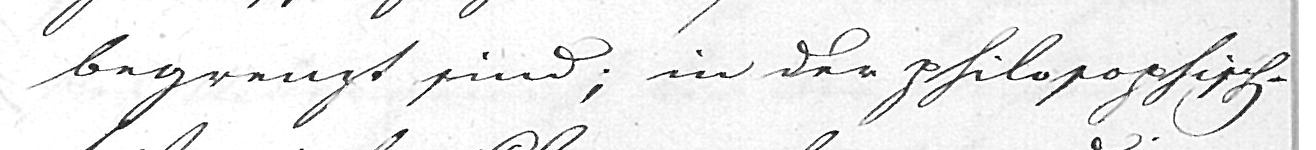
begrenzt sind; in der philosophisch-
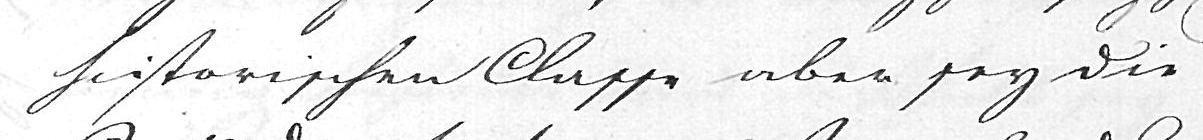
historischen Classe aber sey die
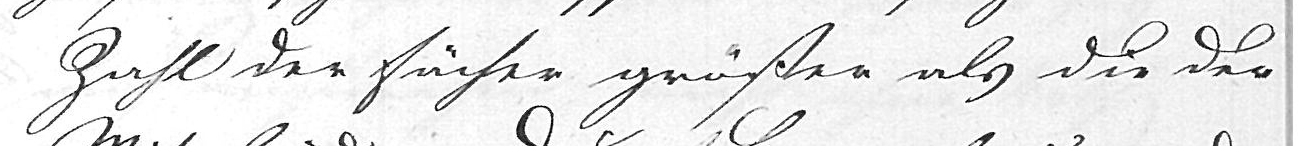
Zahl der Fächer größer als die der
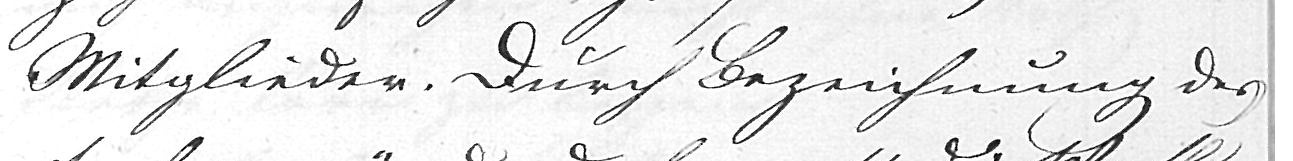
Mitglieder. Durch Bezeichnung des
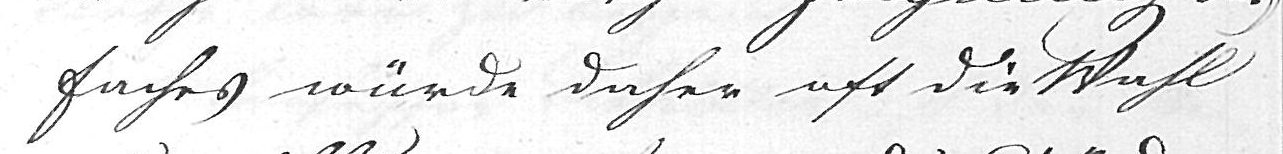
Faches würde daher oft die Wahl
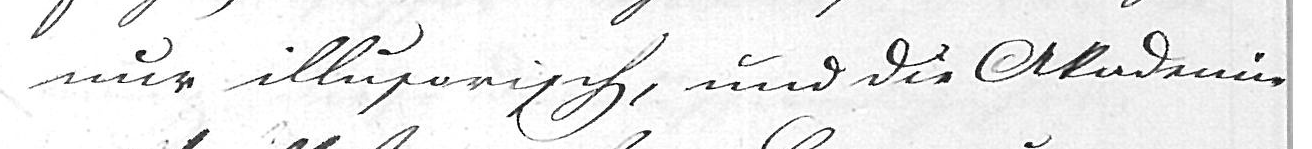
nur illusorisch, und die Akademie
